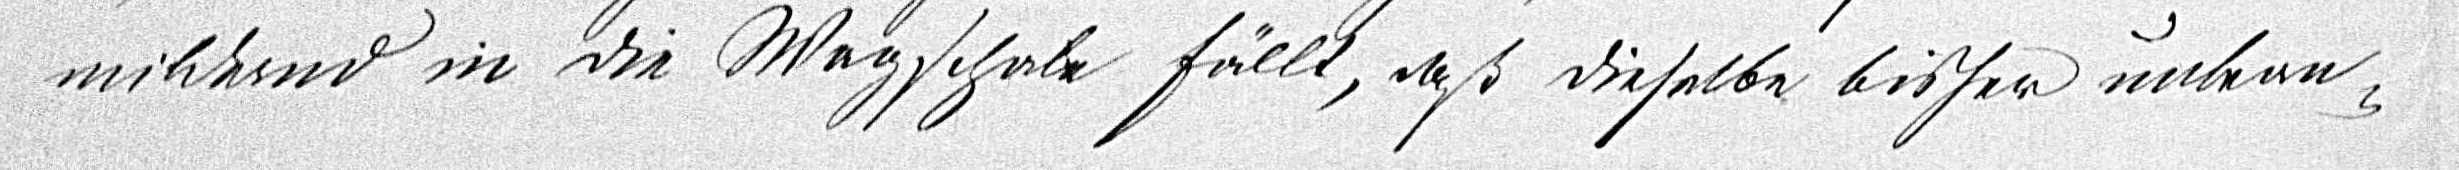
mildernd in die Wagschale fällt, daß dieselbe bisher unbean¬
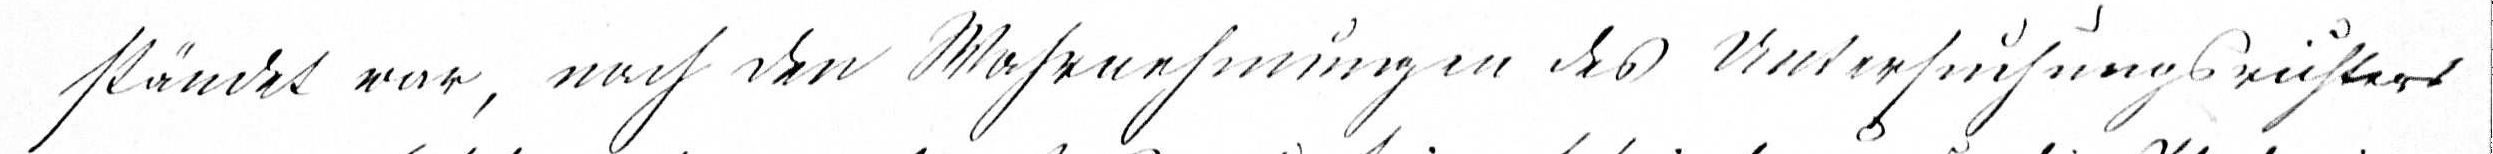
ständet war, nach den Wahrnehmungen des Untersuchungsrichters
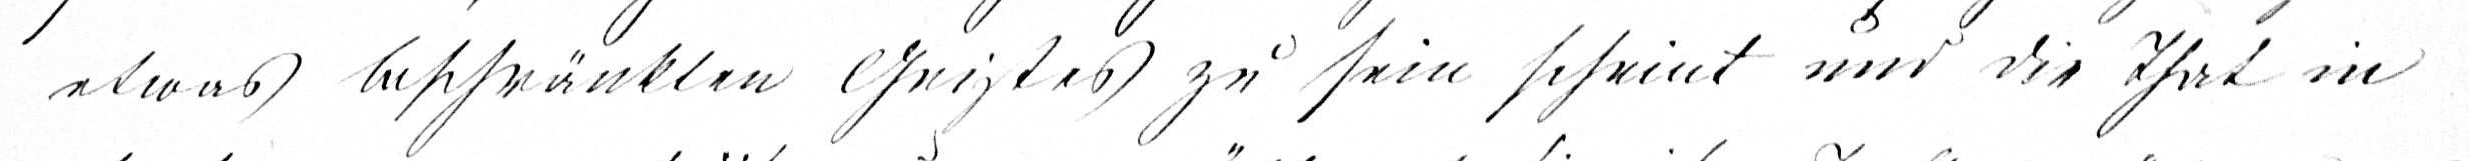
etwas beschwänkten Geistes zu sein scheint und die That in
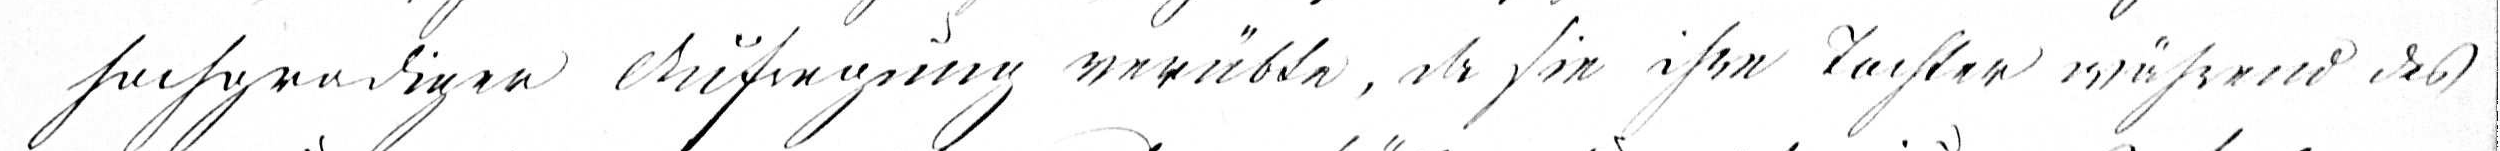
hochgradiger Aufregung verübte, da sie ihre Tochter während des
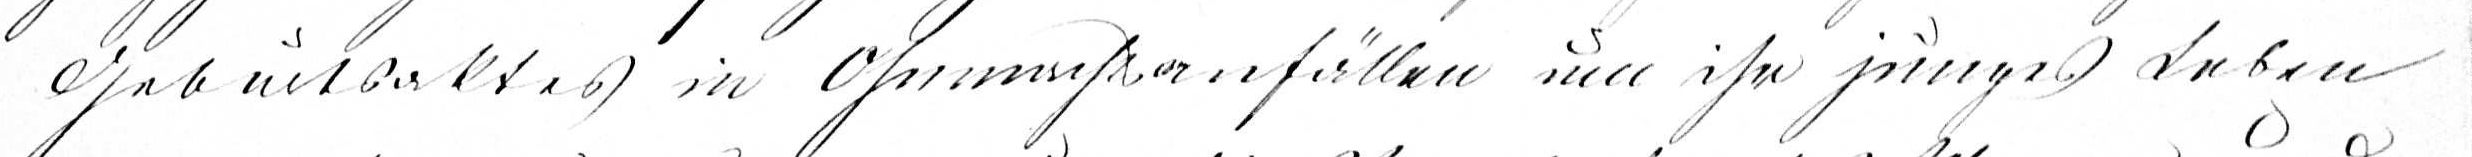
Geburtsaktes in Gemuthsanfällen um ihr junges Leben
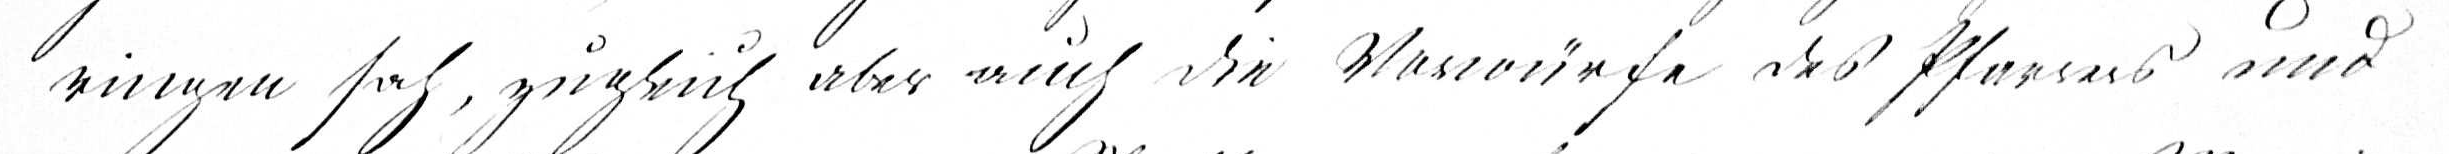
ringen sah, zugleich aber auch die Vorwürfe des Pfarrers und
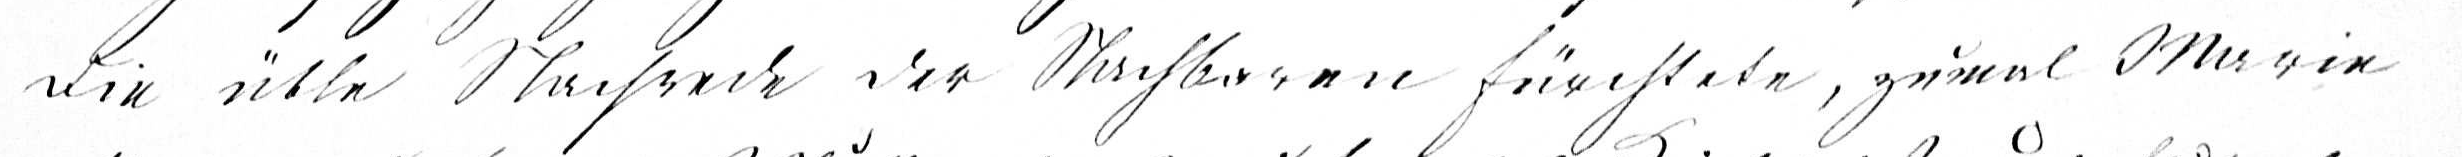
die üble Nachrede der Nachbaren fürchtete, zumal Marie
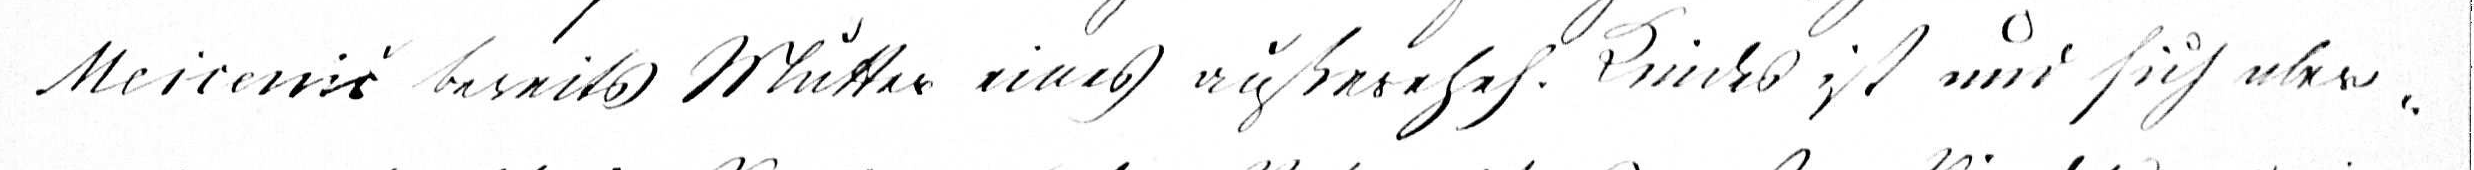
Meicenič bereits Mutter eines außerehel. Kindes ist und sich aber¬
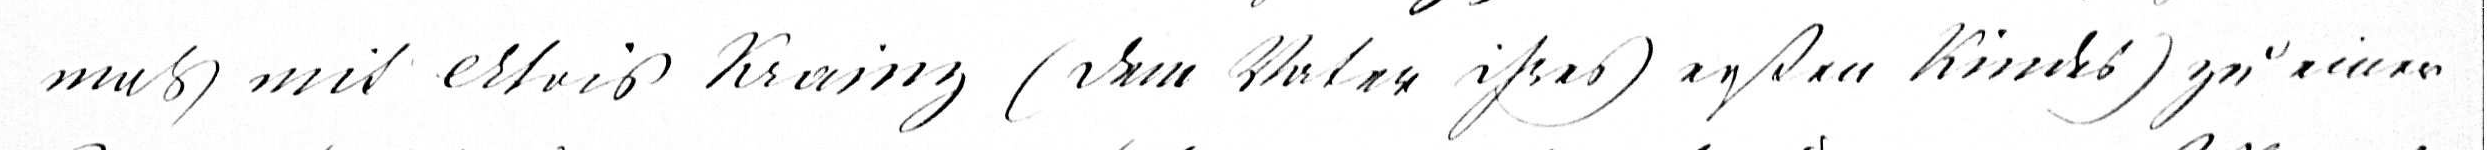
mals mit Alois Krainz (dem Vater ihres ersten Kindes) zu einer
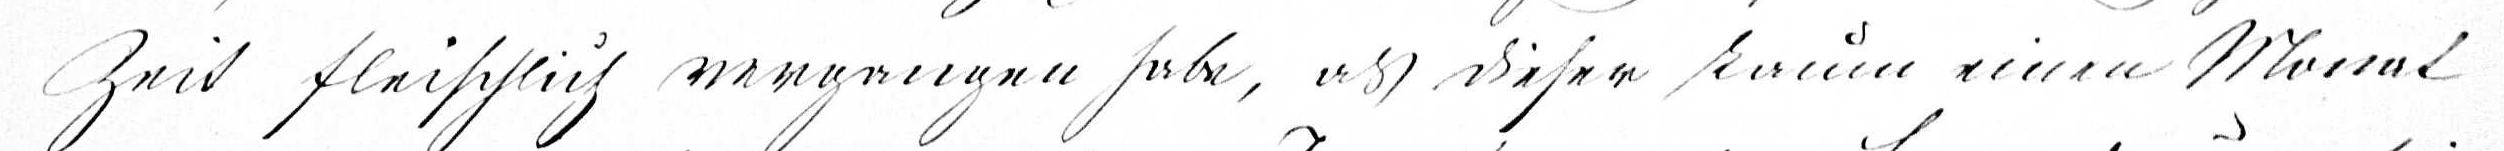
Zeit fleischlich [carnally] vergangen haben als dieser kaum einen Monat
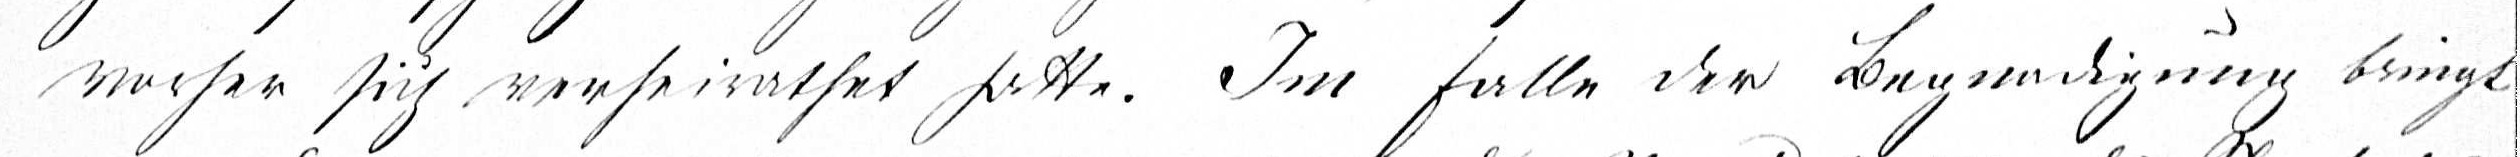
vorher sich verheirathet hatte. Im Falle er Begnadigung bringt
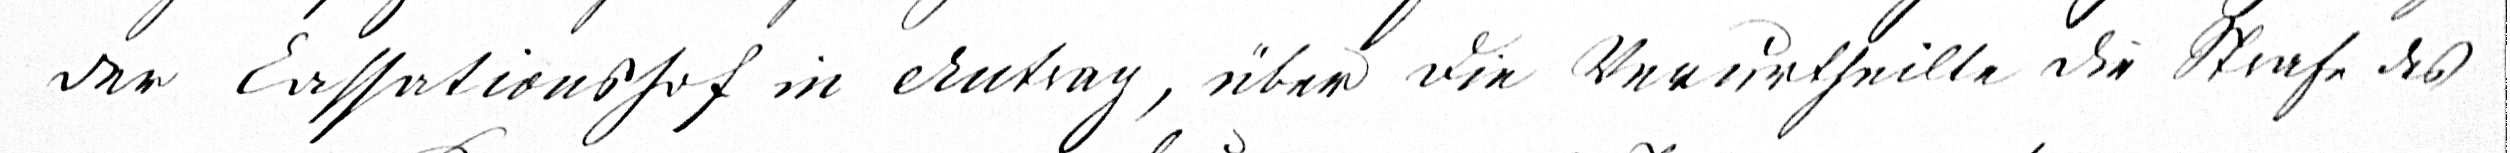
der Cassationshof in Antrag, über die Verurtheilte die Strafe des
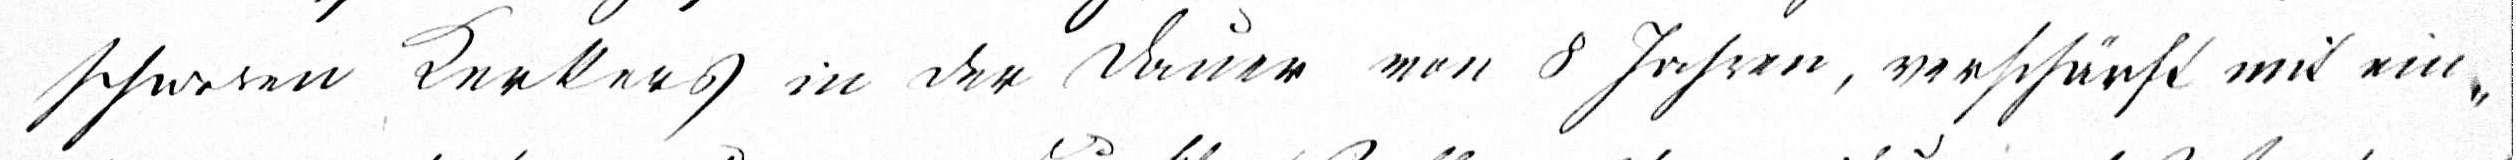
schweren Kerkers in der Dauer von 8 Jahren, verschärfte mit ein¬
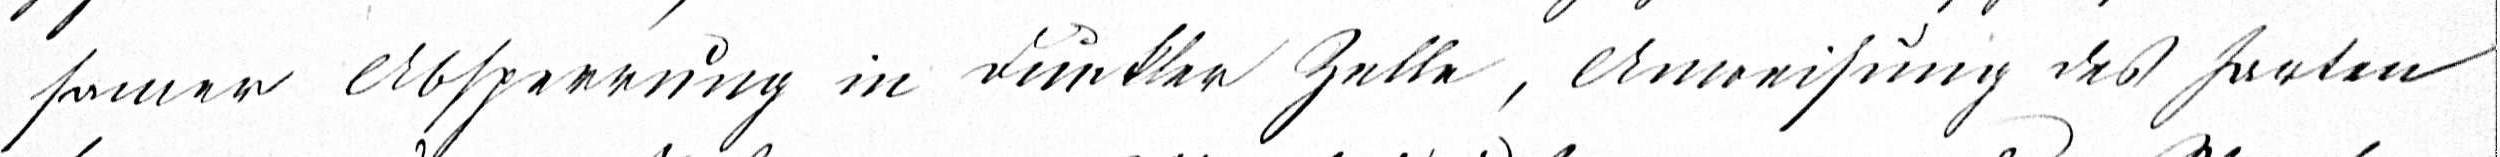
samer Absperrung in dunkler Zelle, Anweisung des harten
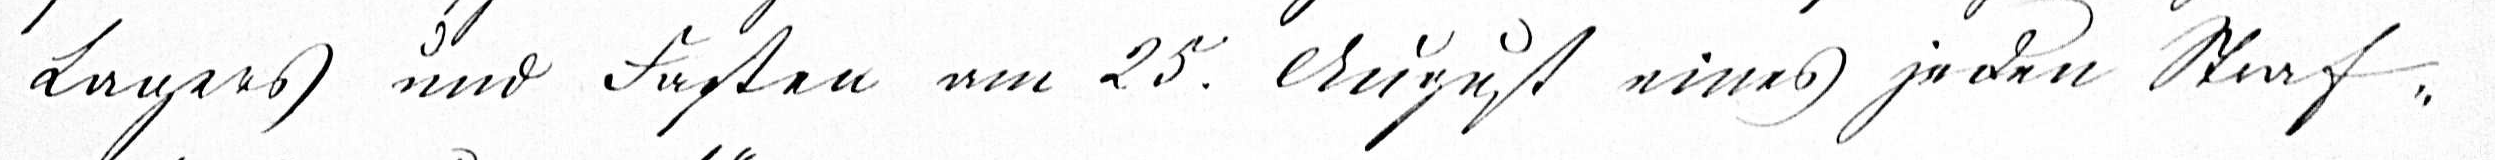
Lagers und Fasten am 25. August eines jeden Straf¬
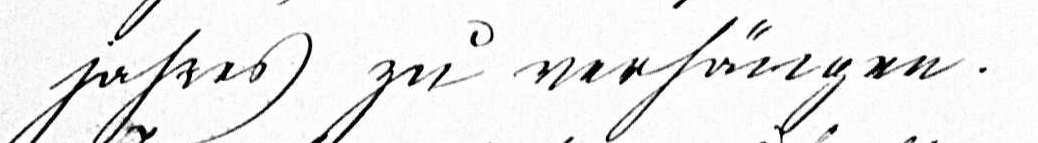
jahres zu verhängen.
